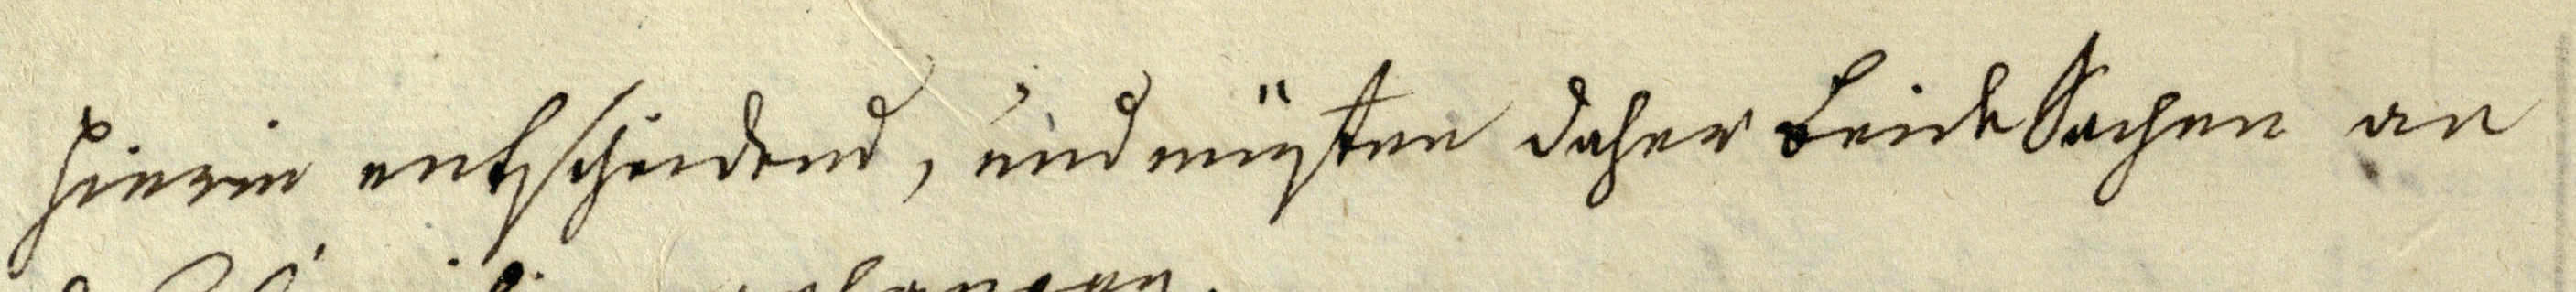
hierin entscheidend, und müsten daher beide Sachen an
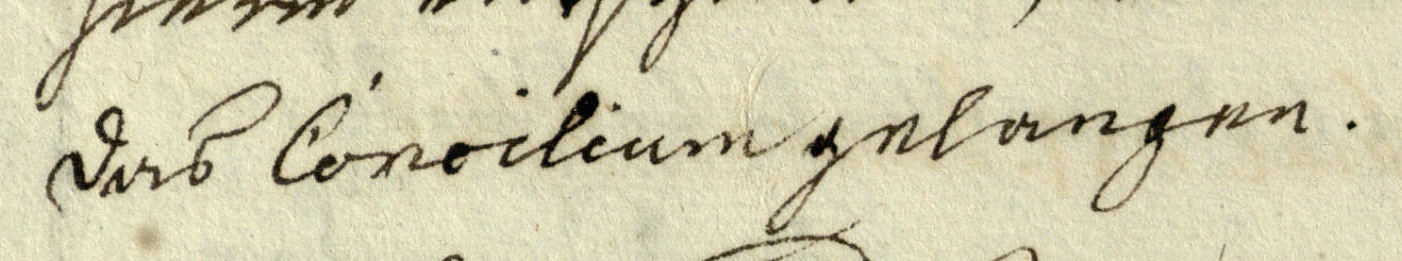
das Concilium gelangen.
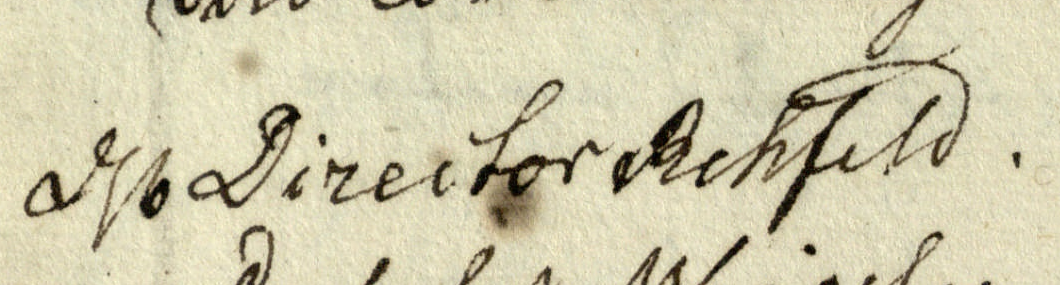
dh Director Rehfeld.
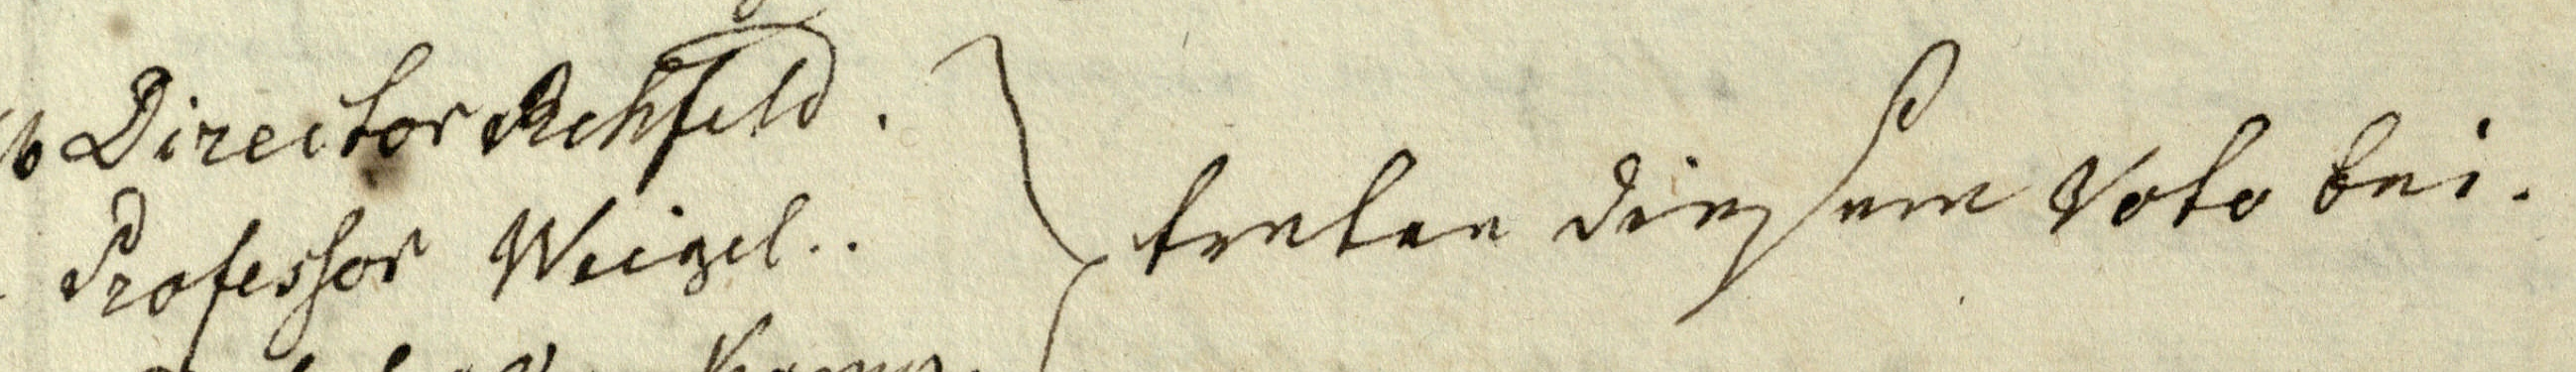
Professor Weigel. treten diesem voto bei.
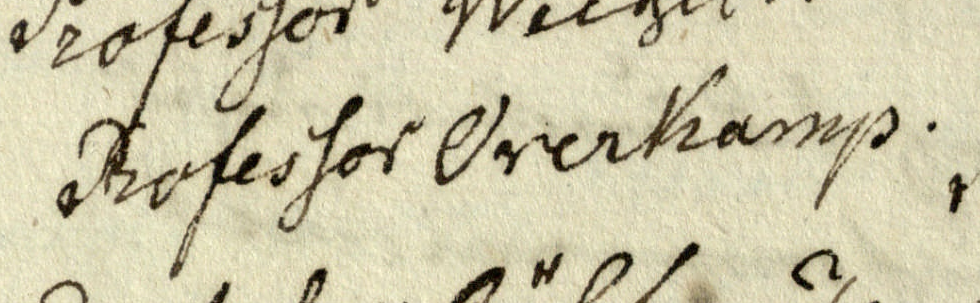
Professor Overkamp.
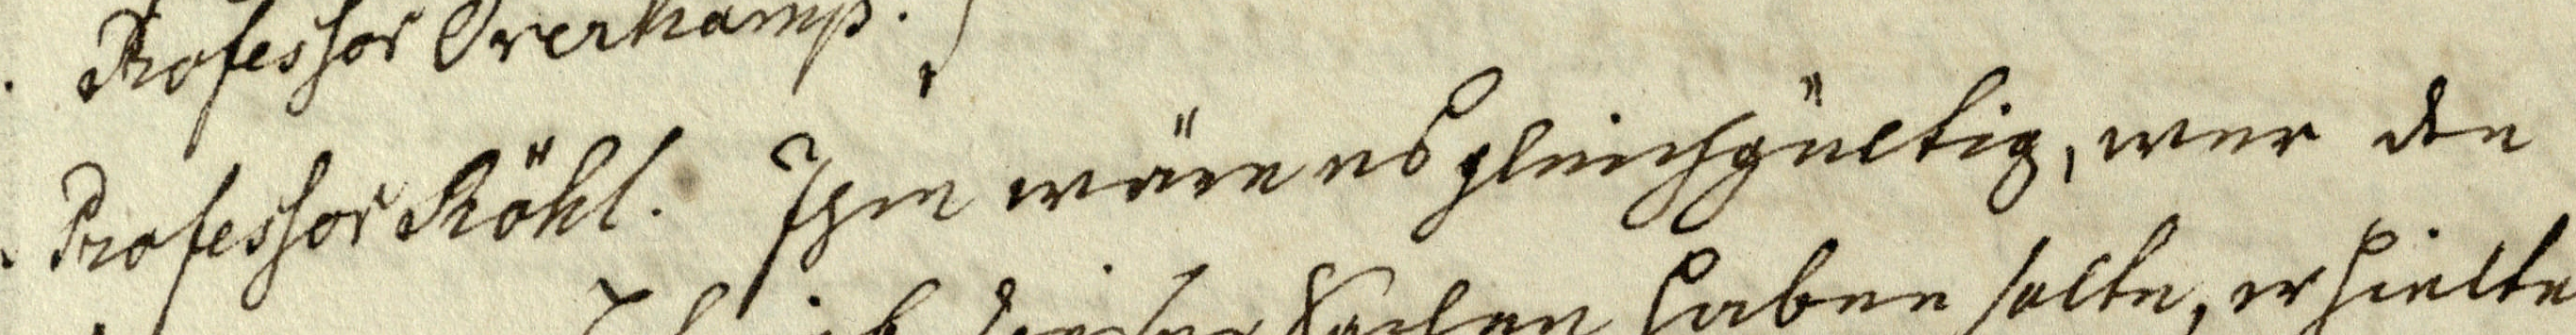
Professor Röhl. Ihm wäre es gleichgültig wer den
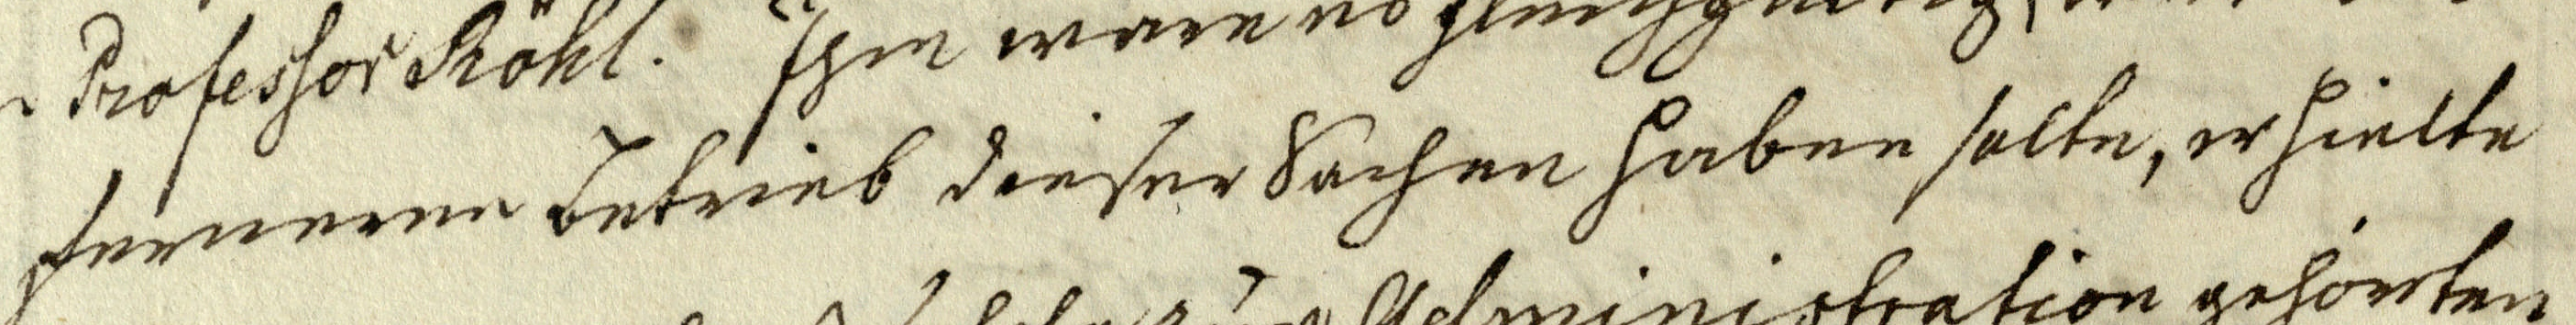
ferneren Betrieb dieser Sachen haben solte, er hielte
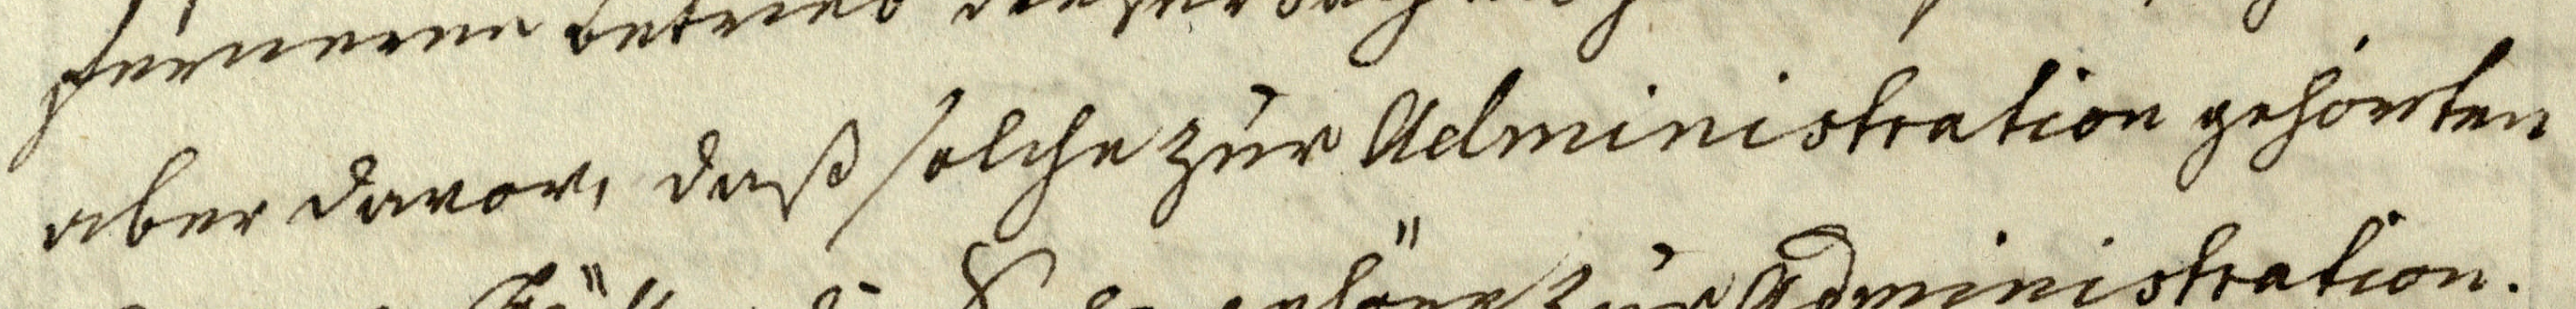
aber davor, daß solche zur Administration gehörten.
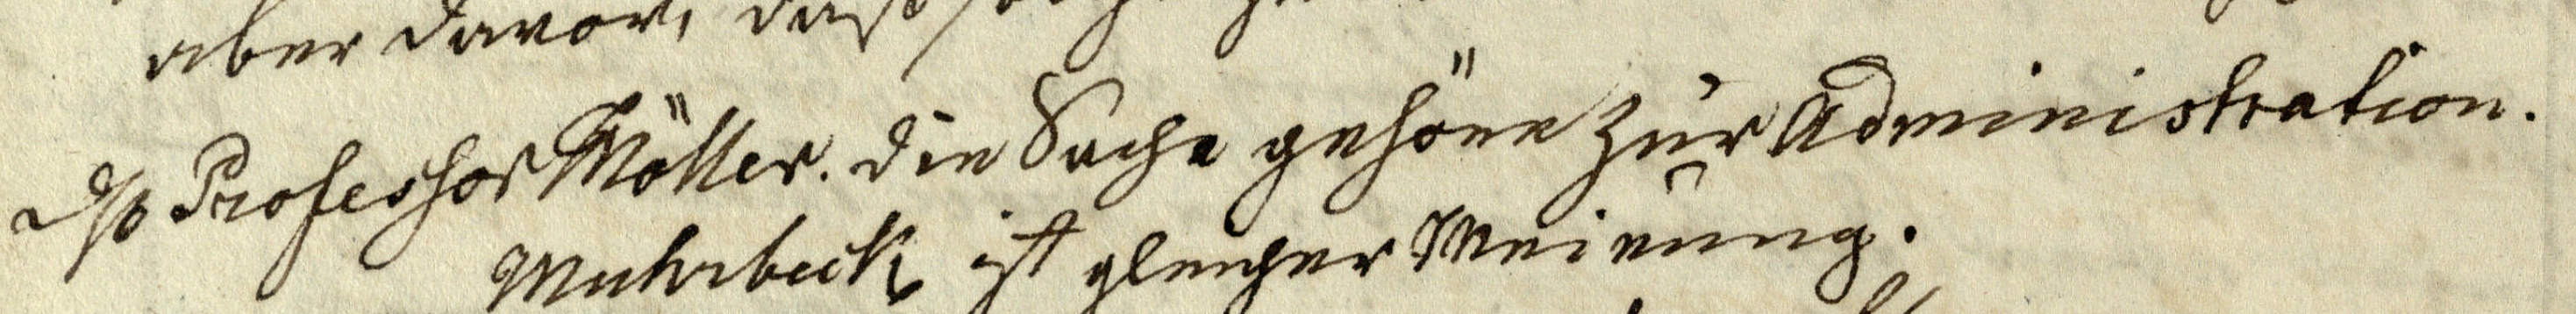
dh Professor Möller. die Sache gehöre zur Administration.
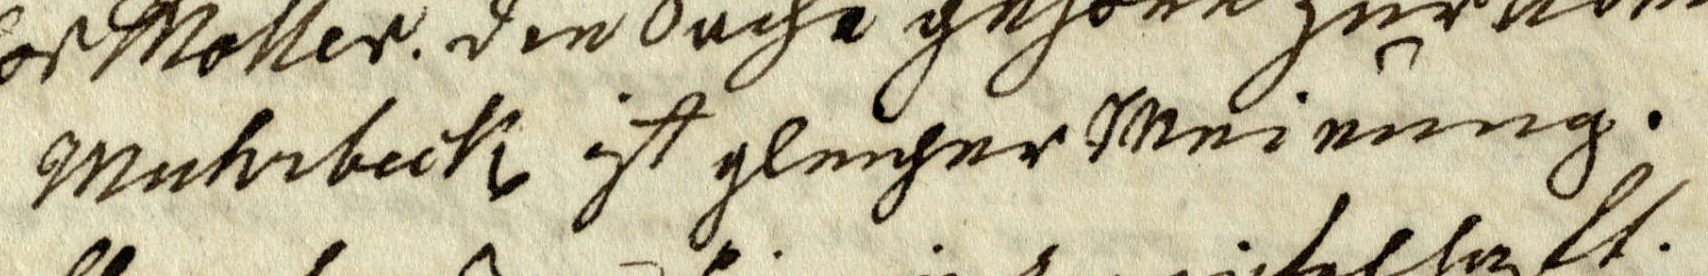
Muhrbeck ist gleicher Meinung.
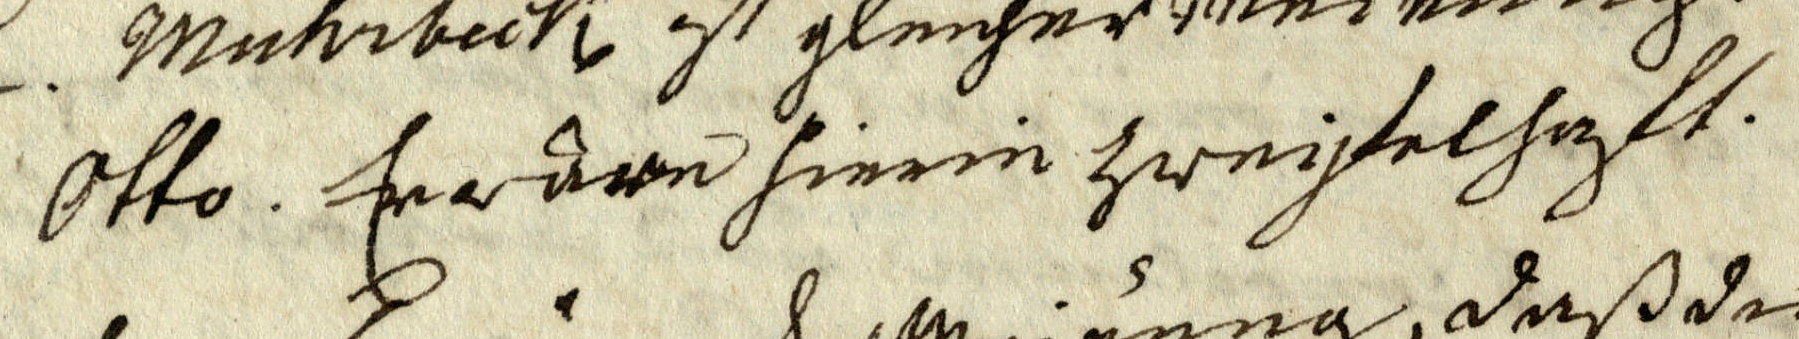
Otto. Er wäre hierin zweifelhaft.
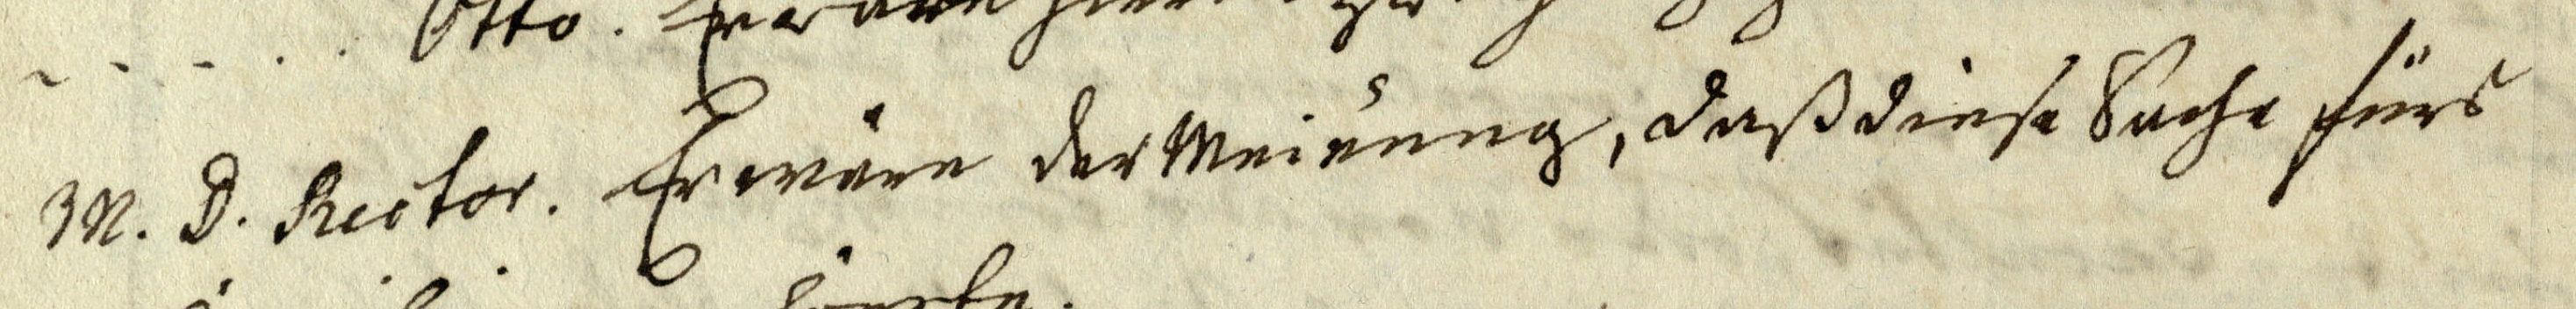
M. D. Rector. Es wäre der Meinung, daß diese Sache fürs
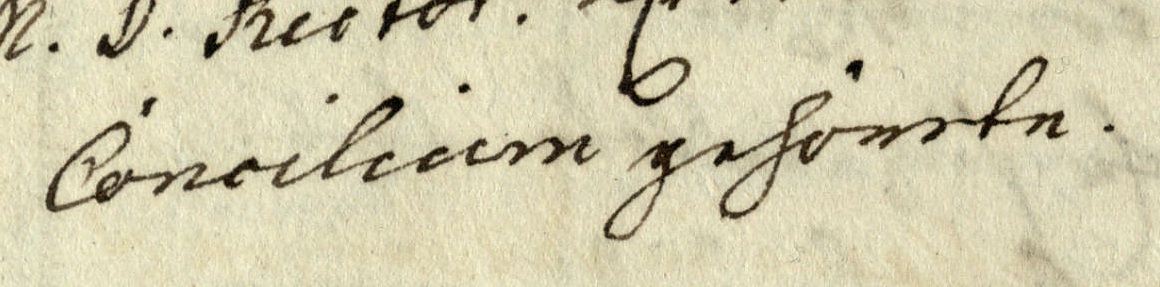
Concilium gehörte.
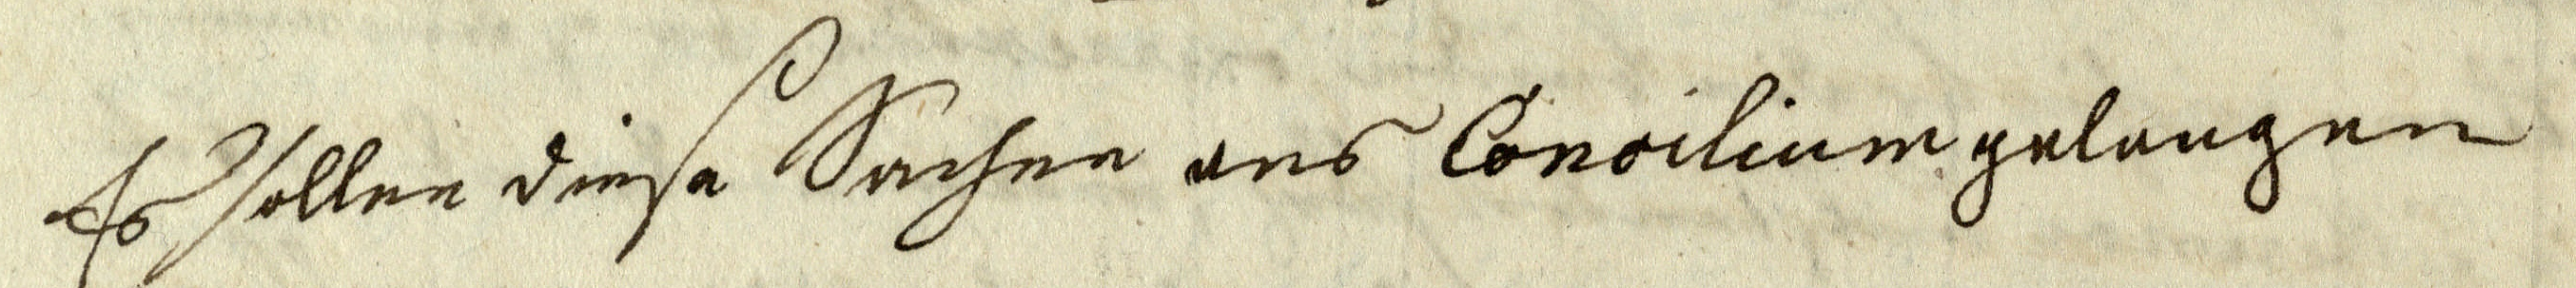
Es sollen diese Sachen ans Concilium gelangen
